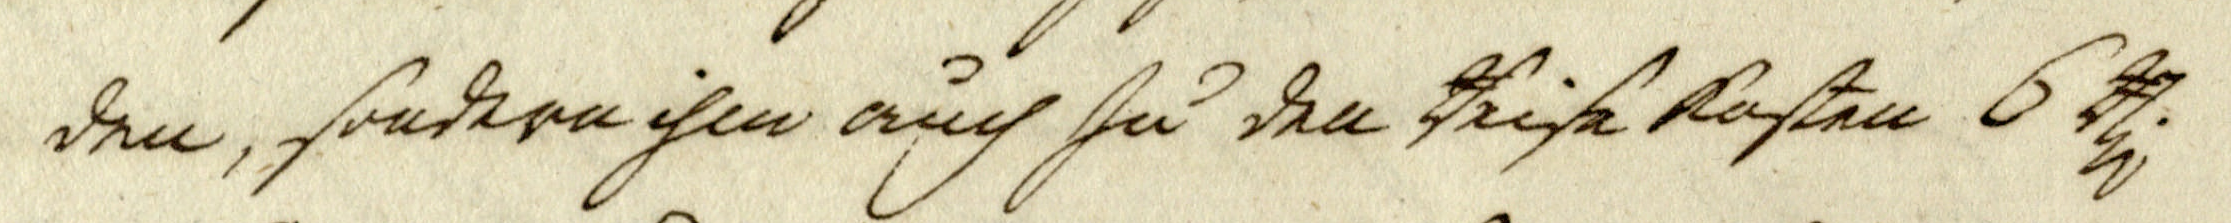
den, sondern ihm auch zu den Reise Kosten 6 Rt.
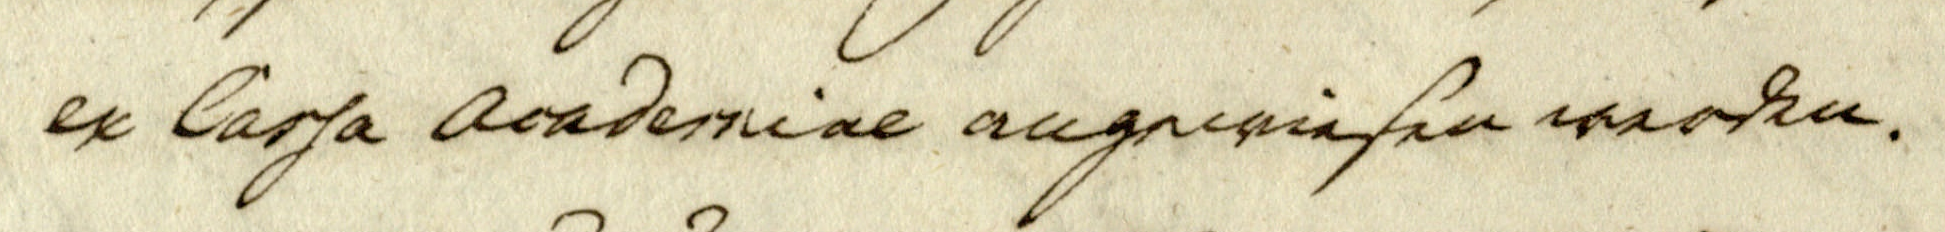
ex Cassa Academiae angewiesen werden.
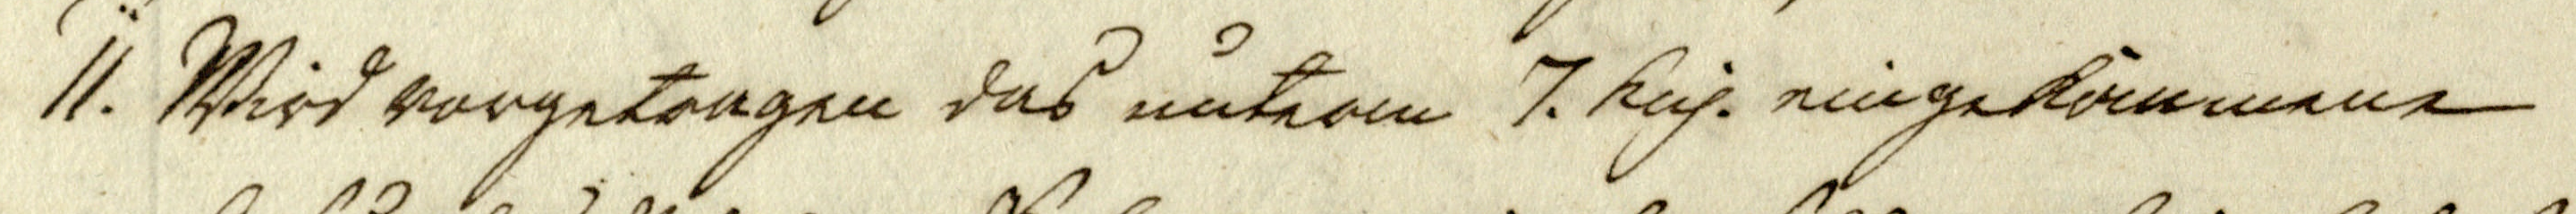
11. Wird vorgetragen das unterm 7. huj. eingekommene
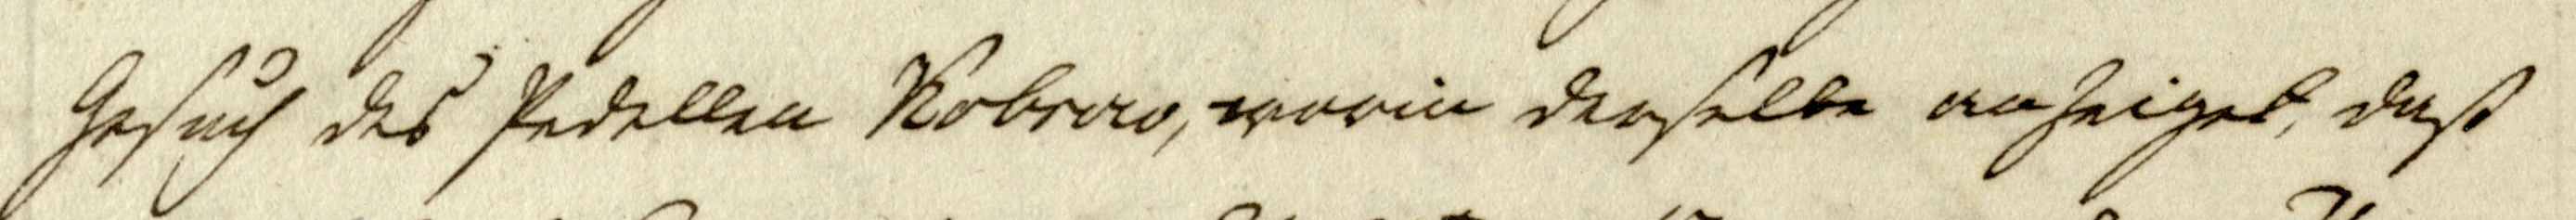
Gesuch des Pedellen Kobrow, worin derselbe anzeiget, daß
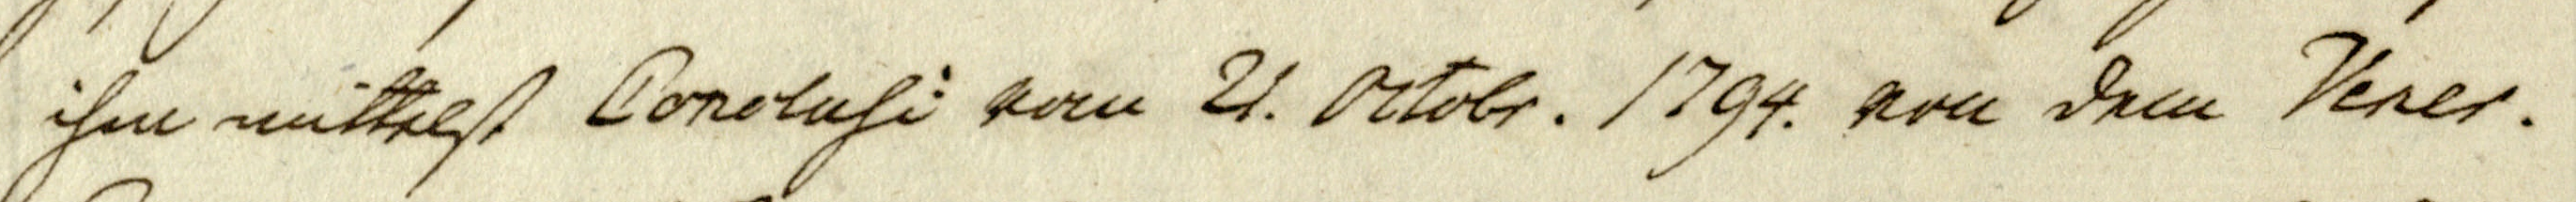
ihm mittelst Conclusi vom 21. Octobr. 1794. von dem Vener.
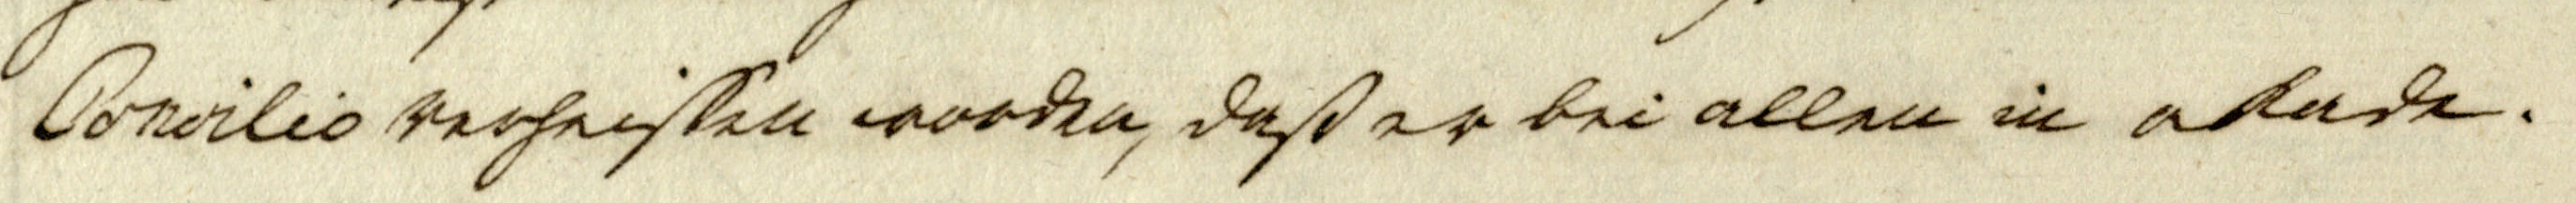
Concilio verheissen worden, daß er bei allen in akade¬
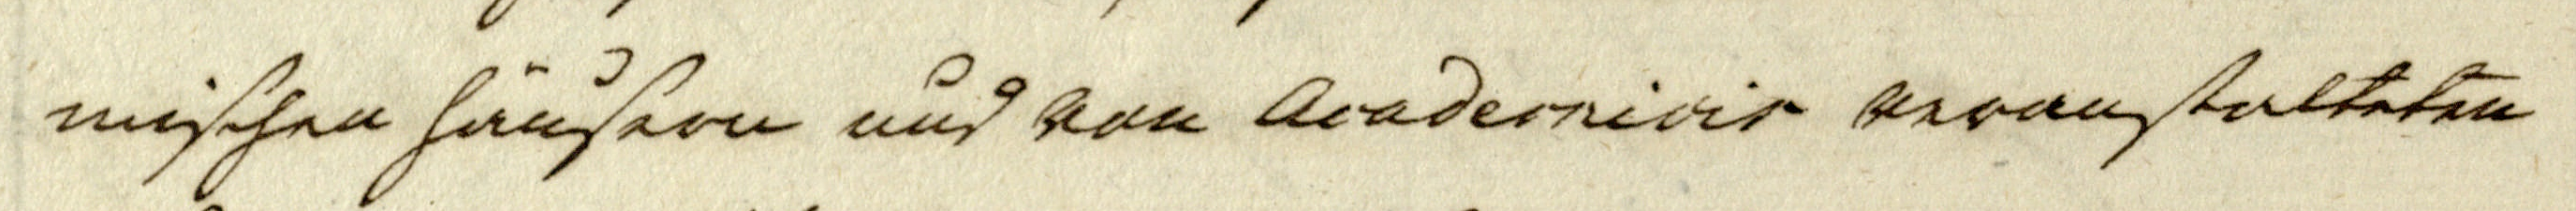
mischen Häusern und von Academicis veranstalteten
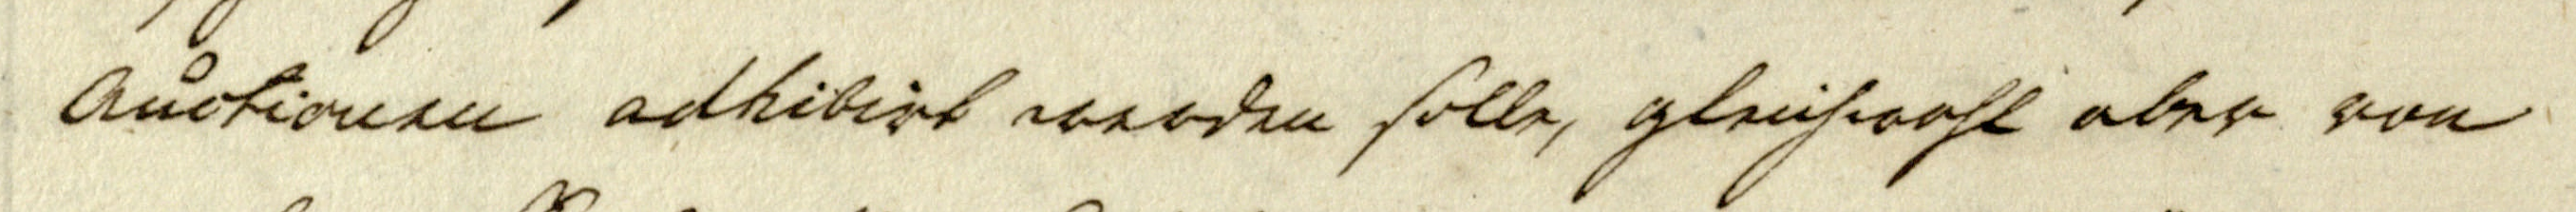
Auctionen adhibirt werden solle, gleichwohl aber von
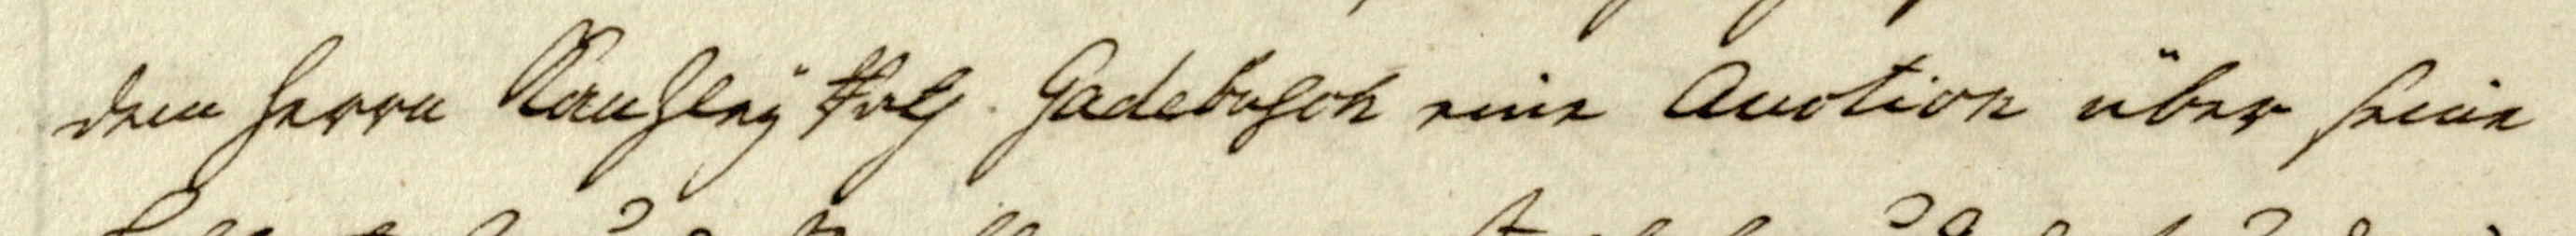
dem herrn Kanzleÿ Rath Gadebusch eine Auction über seine
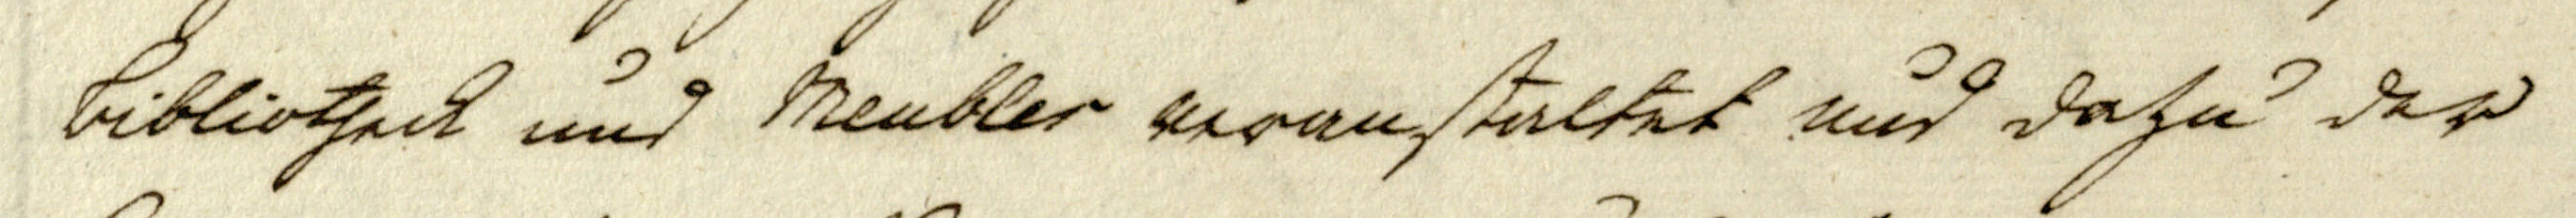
Bibliotheck und Meubles veranstaltet und dazu der
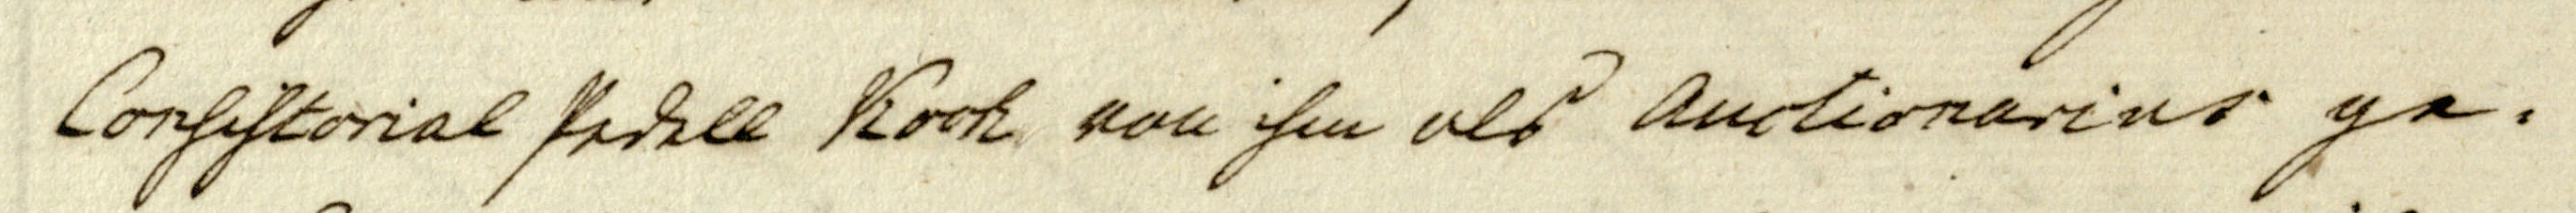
Consistorial Pedell Koch von ihm als Auctionarius ge¬
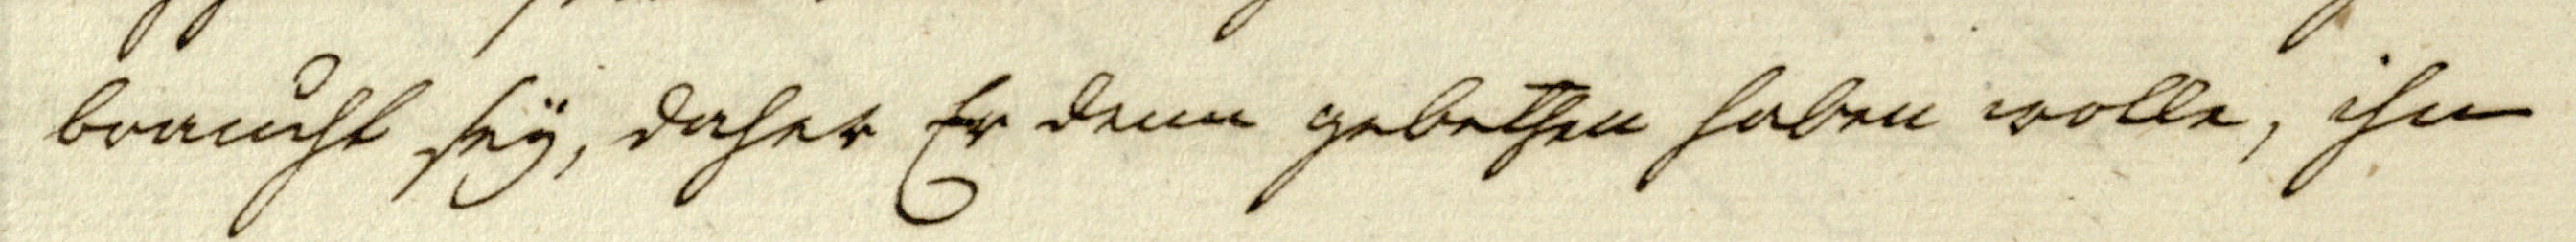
braucht seÿ, daher Er denn gebethen haben wolle, ihm
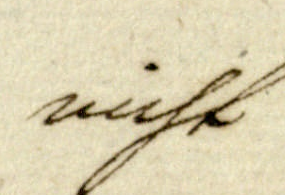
nicht
